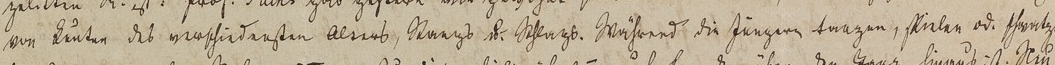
von Leuten des verschiedensten Alters, Rangs u. Schlags. Während die Jüngern tanzen, spielen od. schwatzen
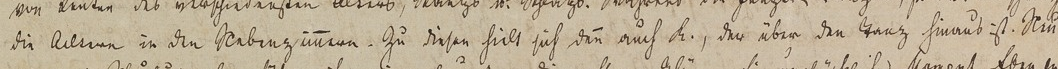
die Aeltern in den Nebenzimmern. Zu diesen hielt sich denn auch R., der über den Tanz hinaus ist. Neu-
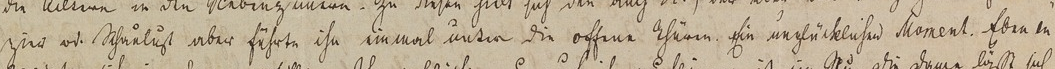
gier od. Schaulust aber führte ihn einmal unter die offene Thüren. Ein unglücklicher Moment. Eben en-
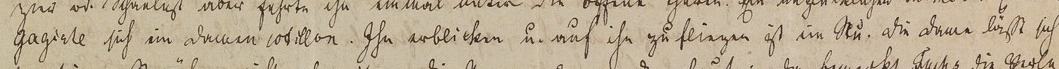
gagirte sich ein Damencotillon. Ihn erblicken u. auf ihn zu fliegen ist im Nu. Die Dame läßt sich
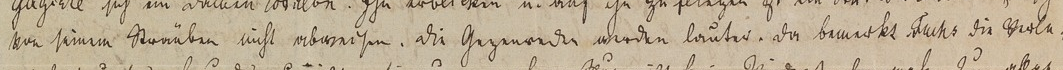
von seinem Sträuben nicht abweisen. Die Gegenreden werden lauter. Da bemerkt Fuchs die Verle-
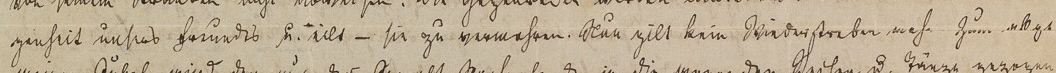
genheit unsers Freundes u. eilt – sie zu vermehren. Nun gilt kein Wiederstreben mehr. Zum allge-
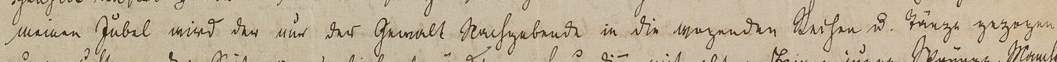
meinen Jubel wird der nur der Gewalt Nachgebende in die wogenden Reihen u. Tänze gezogen
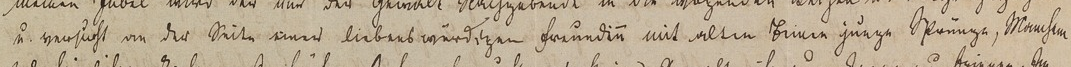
u. versucht an der Seite einer liebenswürdigen Freundinn mit alten Beinen junge Sprünge, Manchem
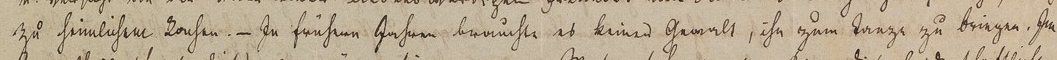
zu heimlichem Lachen. – In frühern Jahren brauchte es keinen Gewalt, ihn zum Tanze zu bringen. Im
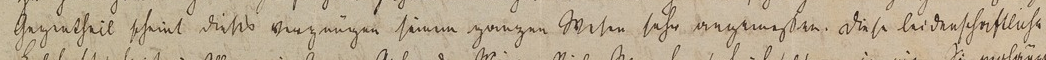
Gegentheil scheint dieses Vergügen seinem ganzen Wesen sehr angemessen. Diese leidenschaftliche
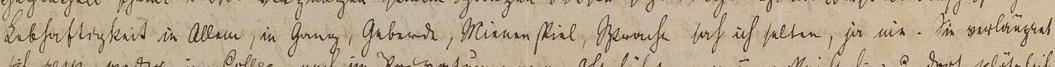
Lebhaftigkeit in Allem, in Gang, Geberde, Mienenspiel, Sprache sah ich selten, ja nie. Sie verläugnet
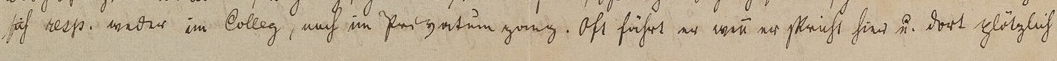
sich resp. weder im Colleg, noch im Privatumgang. Oft fährt er wenn er spricht hier u. dort plötzlich
